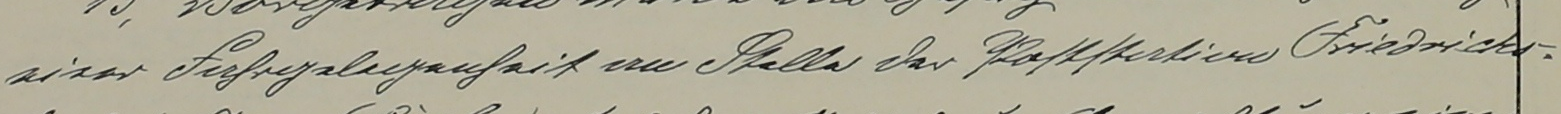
einer Fahrgelegenheit an Stelle der Poststation Friedrichs-
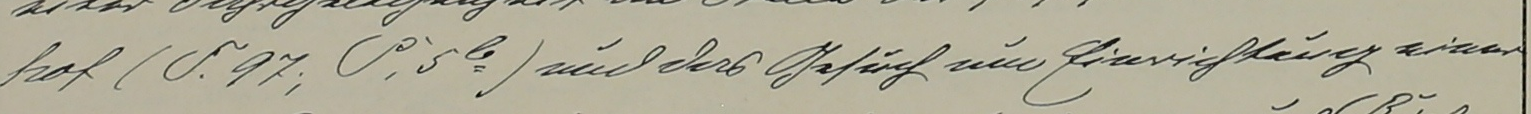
hof (T.97; P.5b) und das Gesuch um Einrichtung einer
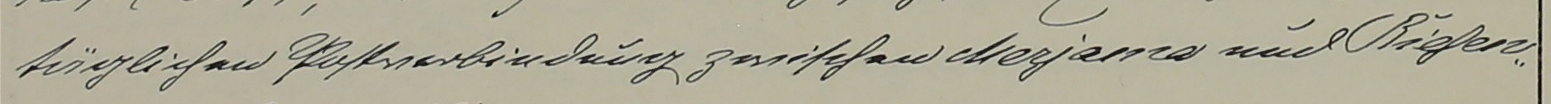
täglichen Postverbindung zwischen Merjama und Riesen-
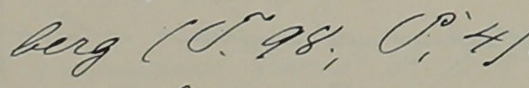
berg (T.98; P.4).
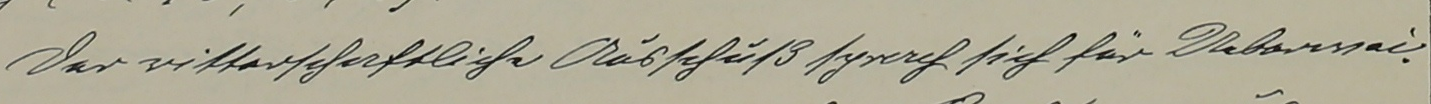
Der ritterschaftliche Ausschuß sprach sich für Ueberwei-
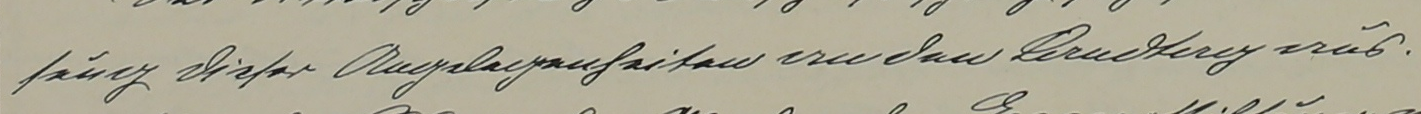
sung dieser Angelegenheit an den Landtag aus.
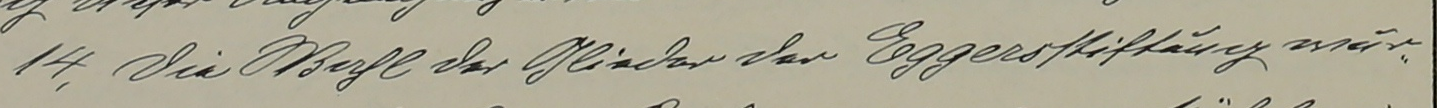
14. Die Wahl der Glieder der Eggersstiftung wur-
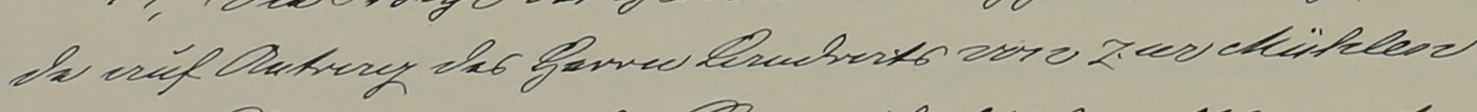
de auf Antrag des Herrn Landrats von zur Mühlen
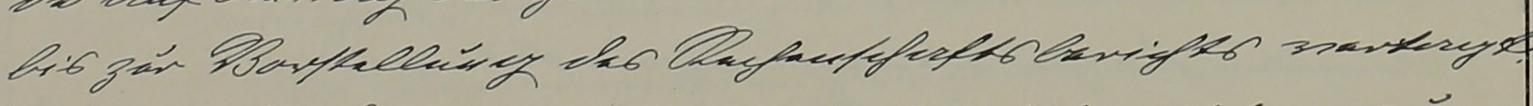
bis zur Vorstellung des Rechenschaftsberichts vertagt.
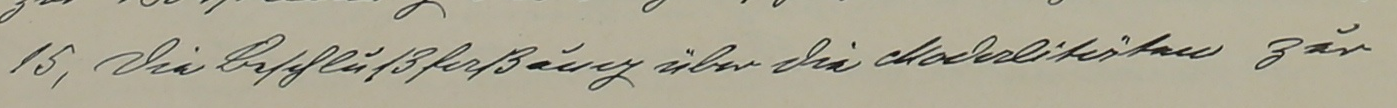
15. Die Beschlußfaßung über die Modalitäten zur
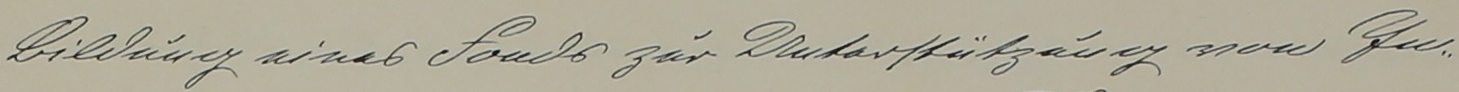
Bildung eines Fonds zur Unterstützung von In-
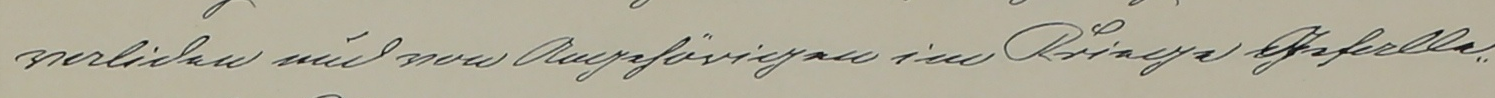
validen und von Angehörigen im Kriege Gefalle-
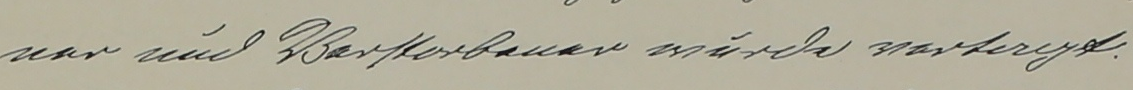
ner und Verstorbener wurde vertagt.
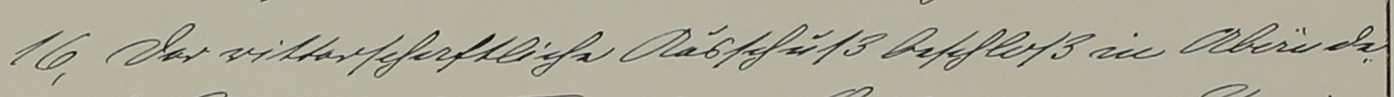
16. Der ritterschaftliche Ausschuß beschloß in Abände-
